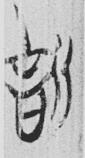○（慎）
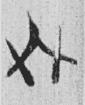夂（終）
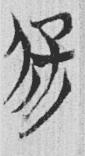保
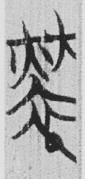○（勞）
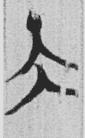大
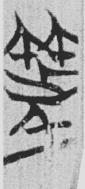○（匡）
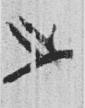之
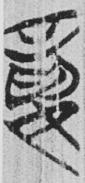○（要）
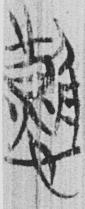戁（難）
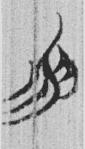易
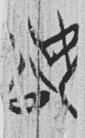欲
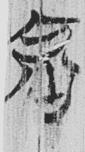○（余）
